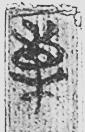犢
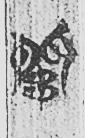{門串}
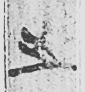之
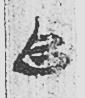𠂤
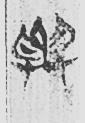與
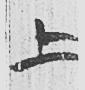上
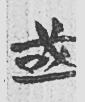或
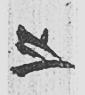之
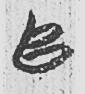𠂤
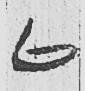㠯（以）
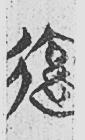{辶交}
